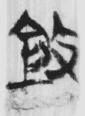{倉攴}
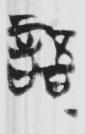語
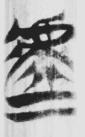虛
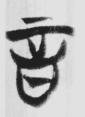言
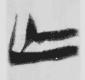亡
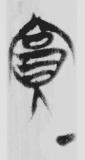{宀員}
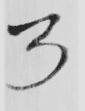乃
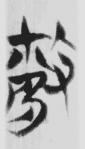{尒白水攴}
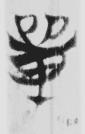單
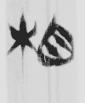相
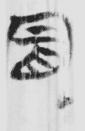冒
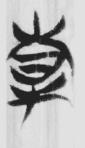倝
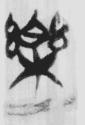樂
